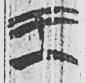王
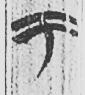于
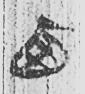西
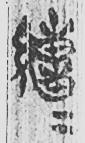糸東田=
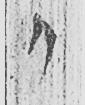人
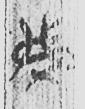弗
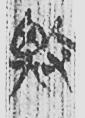{畀攴}
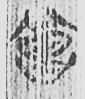曾
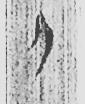人
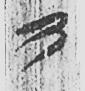乃
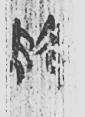降
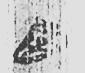西
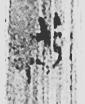戎
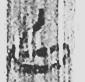㠯（以）
